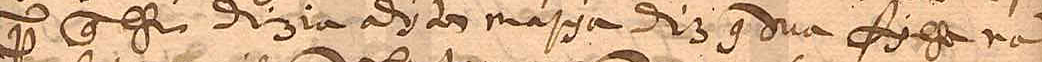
p̄o q̅ lhe dizia a dyta marya diz q̅ sua fylha na̅
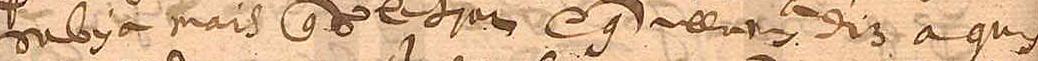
sabya mais q̅ soletrar e q̅ ella ma diz aquy
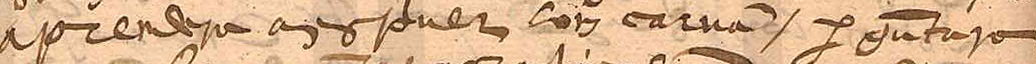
aprendera a esp̅iuer com carua̅ / ꝑgu̅tara
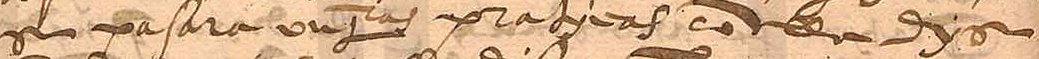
se pasara outras pratycas c̄o ella dyse
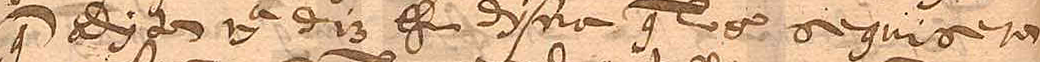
q̅ a dyta ma diz lhe disera q̅ logo se quisera
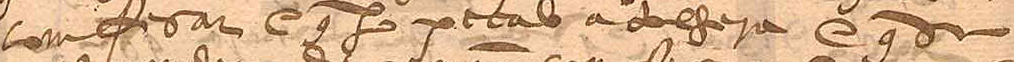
comfesar e q̅ ho pecado a tolhera e q̅ se
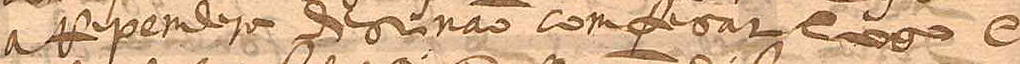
aRependera de se não comfesar logo e
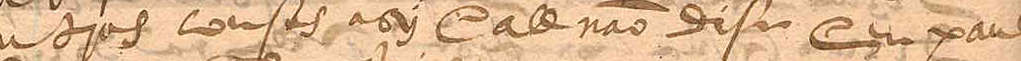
utras cousas asy e all não dise e eu pau
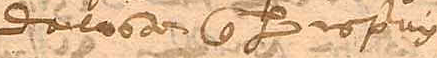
da costa q̅ ho esp̅iuy
